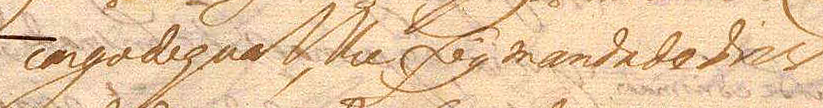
cargo de qual lhe foy mandado dizer
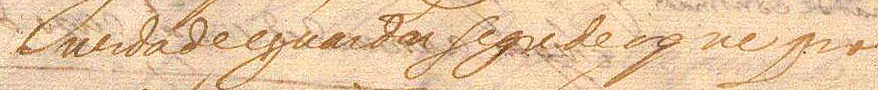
uerdade e guardar segredo o que pro
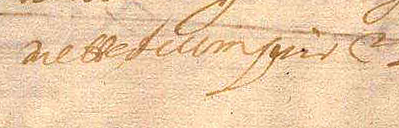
metteo cumprir.
